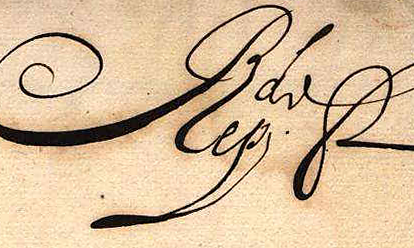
Rep.do fL
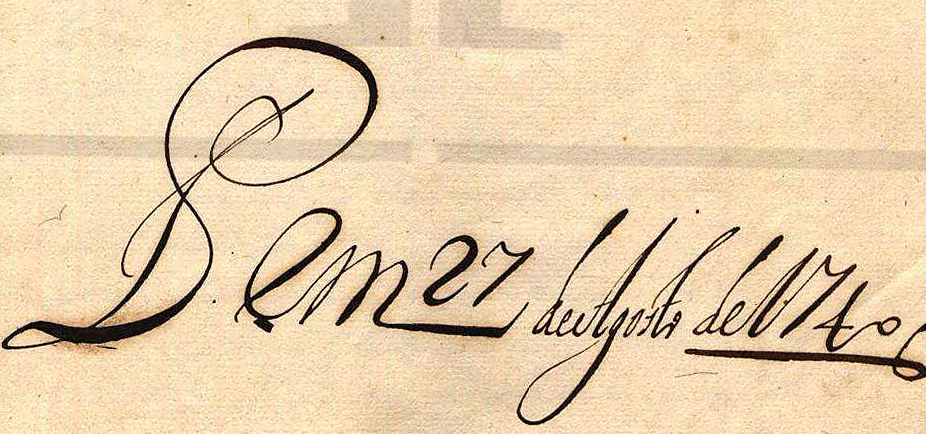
P. Em 27 de Agosto de 1740
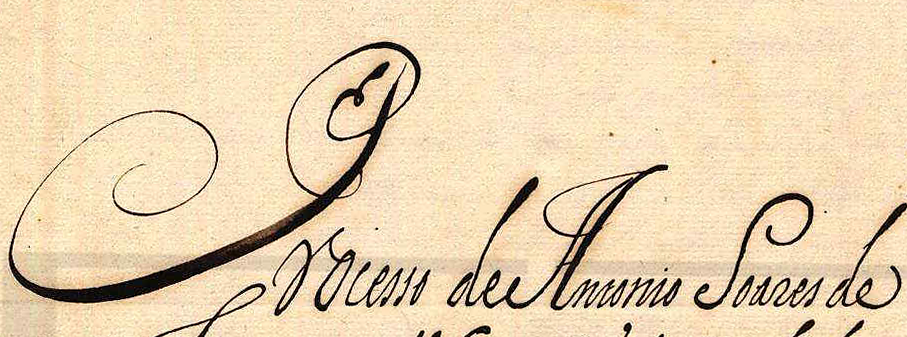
Processo de Antonio Soares de
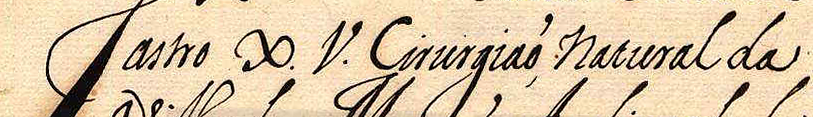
Castro x. V. Cirurgiaõ, natural da
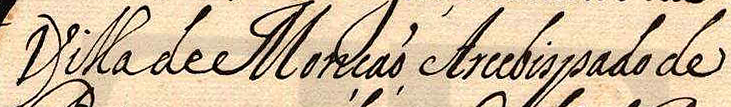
Villa de Monçaõ, Arcebispado de
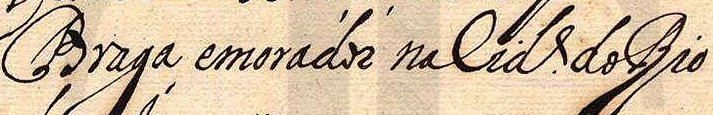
Braga, e morador na Cid.e do Rio
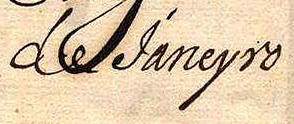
de Ianeyro
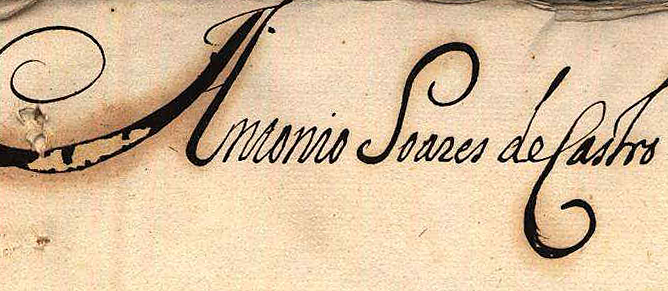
Antonio Soares de Castro
